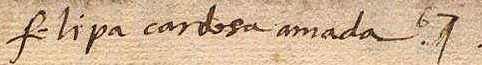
felipa cardosa amada
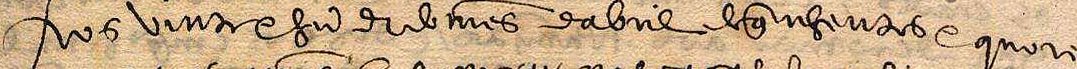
Aos vinte e hū di do mes dabril de q̄nhentos e quorē
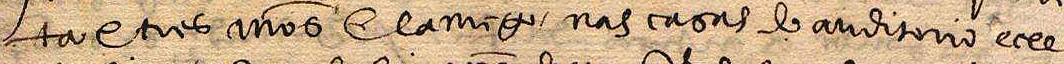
ta e tres anōs ē lamego / nas casas do auditorio ecle
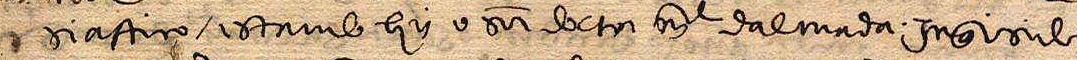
siastico / estando hy o s̄or doctor mel dalmada Jnq̄isidor
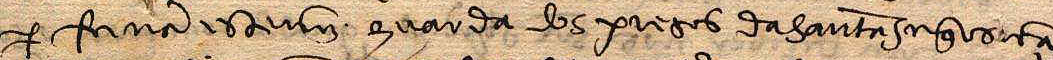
ꝑ fernā esteuez guarda dos presos da santa Jnq̄isiçā
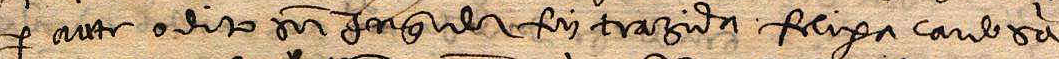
ꝑante o dito s̄or Jnq̄idor foy trazida felipa cardosa
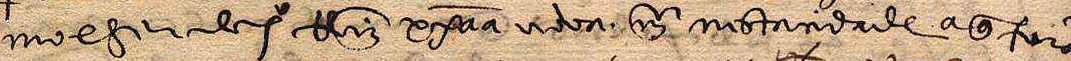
molher de po Rōiz xpāa nova. mor nesta çidade a q̄ forā
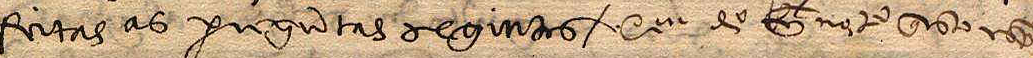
feitas as pregūtas segintes / e eu do R̄z noto q̄ esto esp̄vy
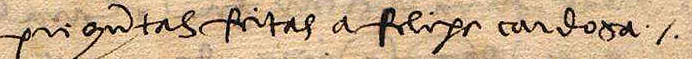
pregūtas feitas a felima cardosa ./.
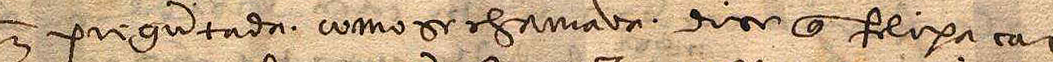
item pregūtada. como se chamava. dise q̄ felipa car
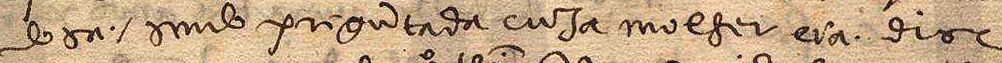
dosa ./ sendo pregūtada cuJa molher era. dise
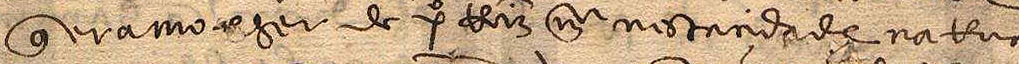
q̄ era molher de po Roīz mor nesta çidade na Rua
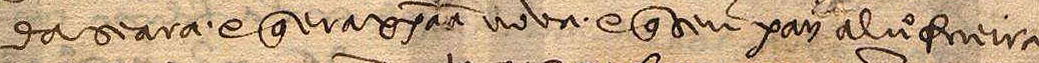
da seara. e q̄ era xpāa nova. e q̄ seu pay aluo fereira
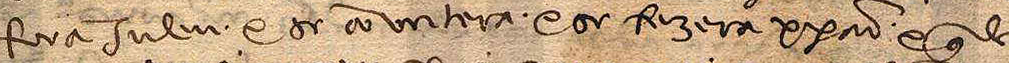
fora Judeu. e se c̄overtera. e se fezera xpão. e q̄ de
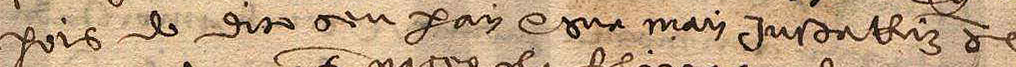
pois do dito seu pay e sua may Justa Roīz se
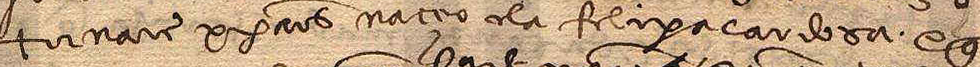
tornarē xpãos naçeo ela felipa cardosa. e q̄
